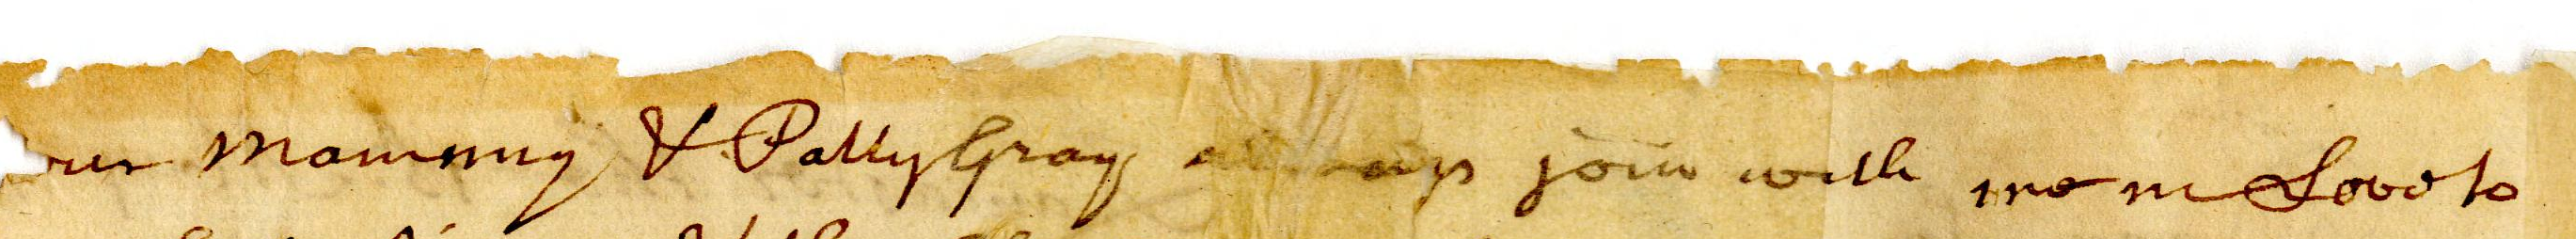[___] Mommy & Polly pray always join with me in Love to
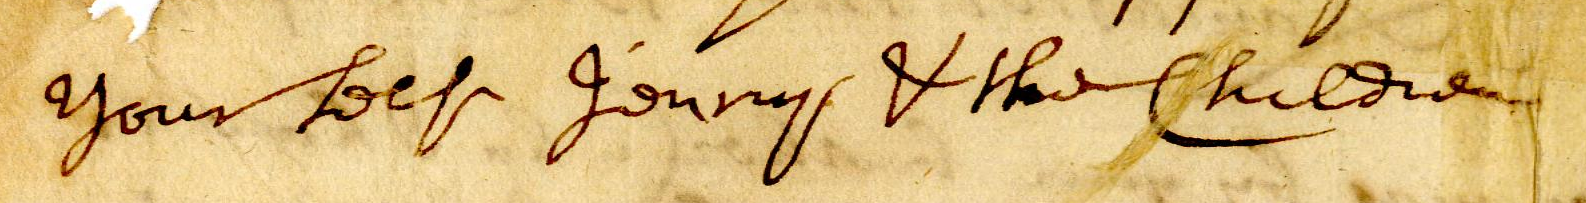Your self Jenny & the Children
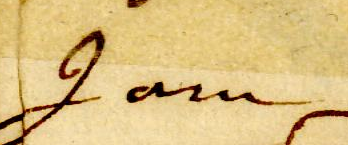I am
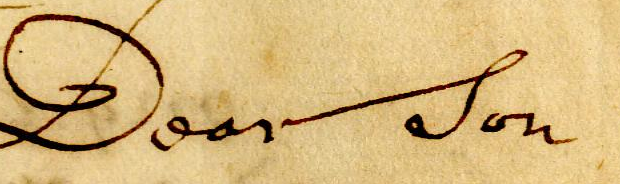Dear Son
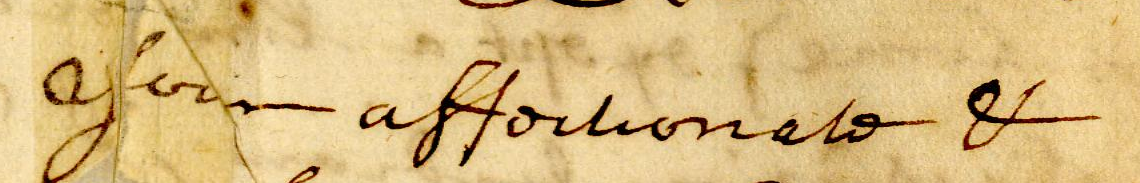Your affectionate &
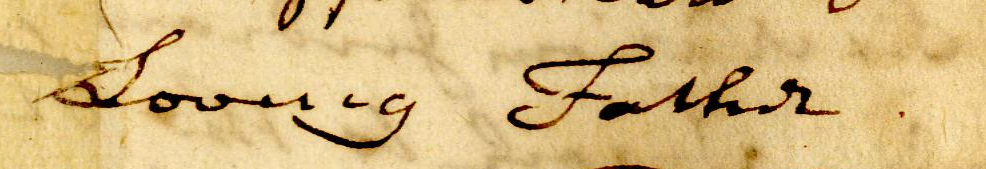Loving Father
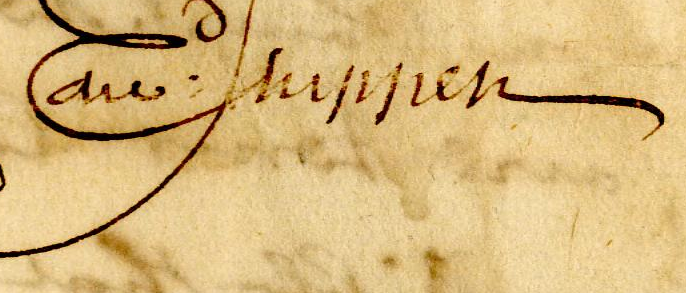Edw. Shippen
